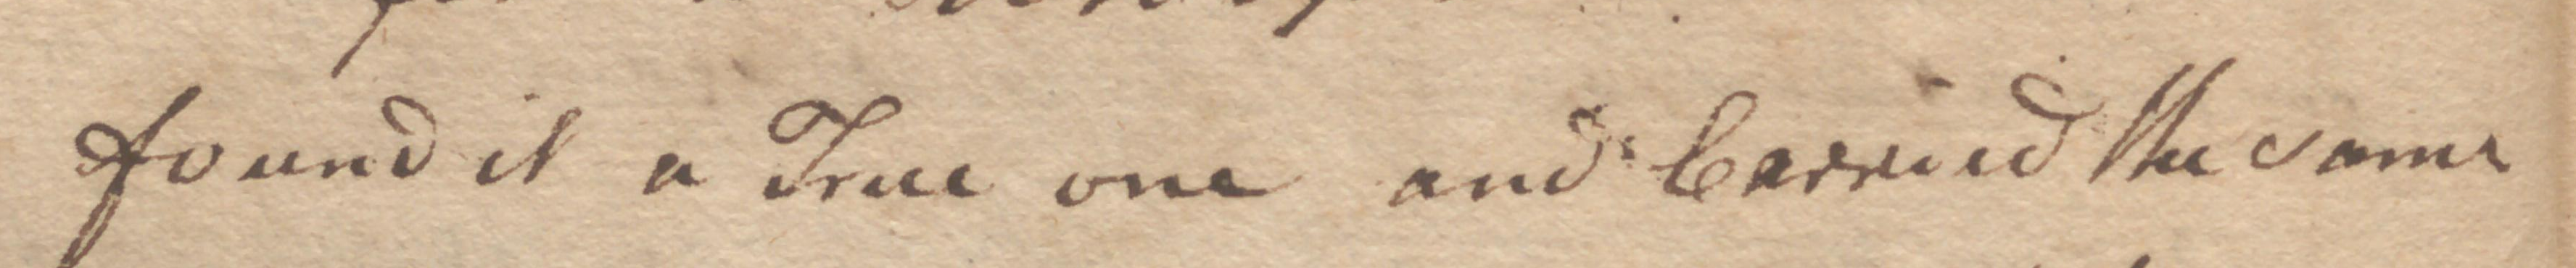found it a True one and Carried the same
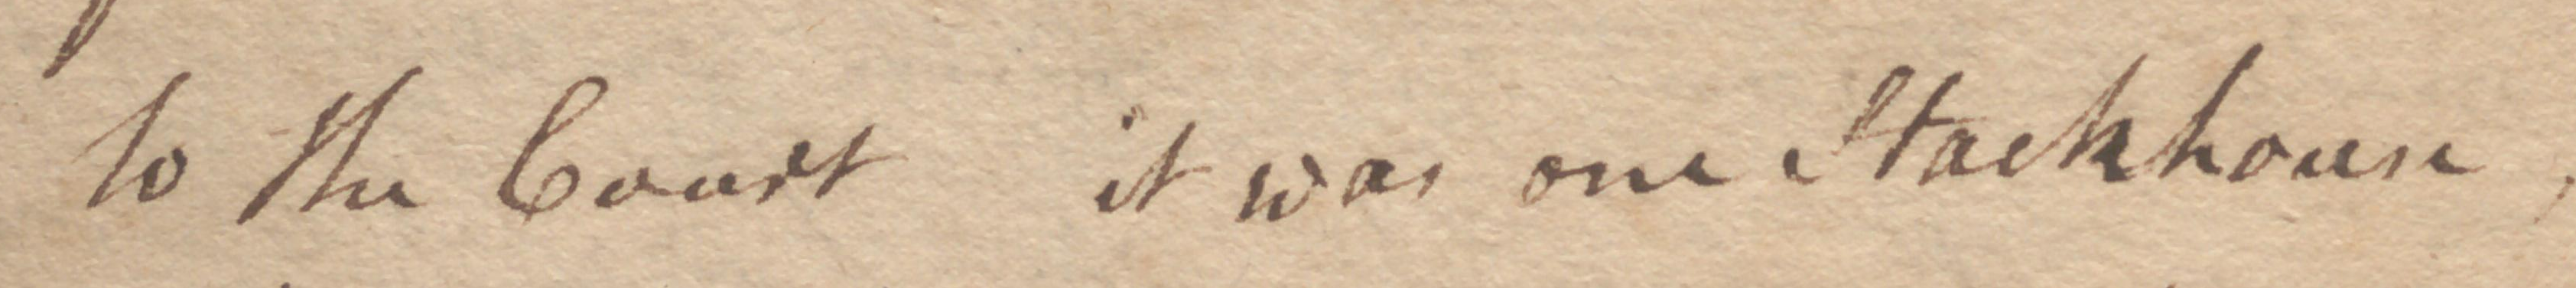to the Court it was one Stackhouse
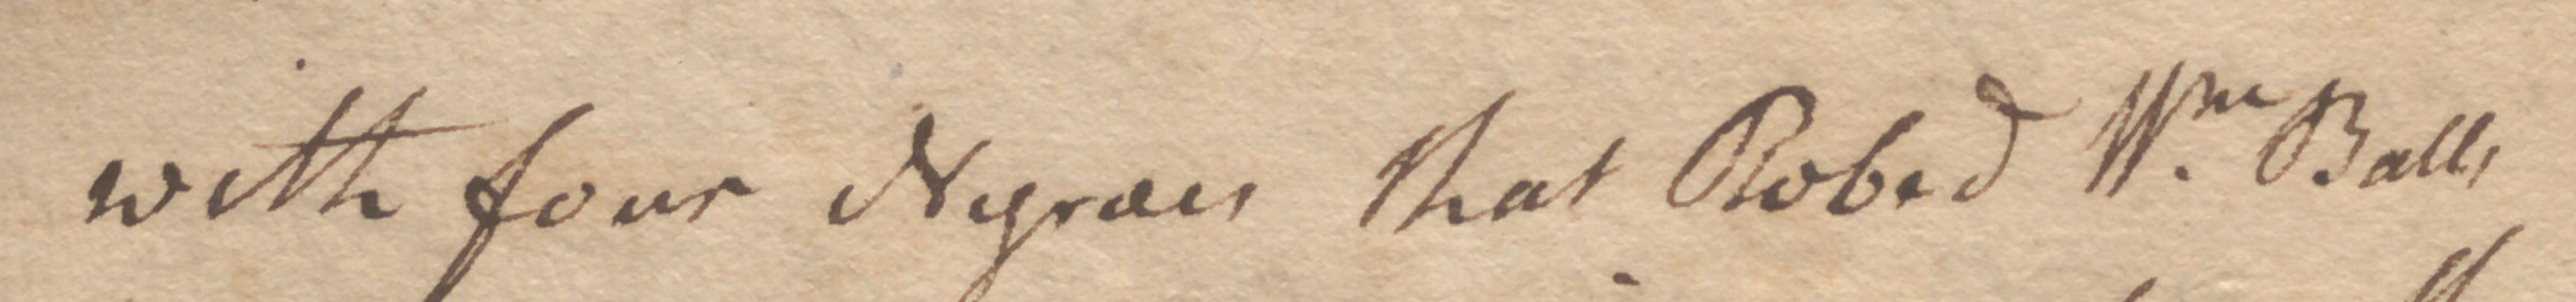with four Negroes that Robed W^m. Balls
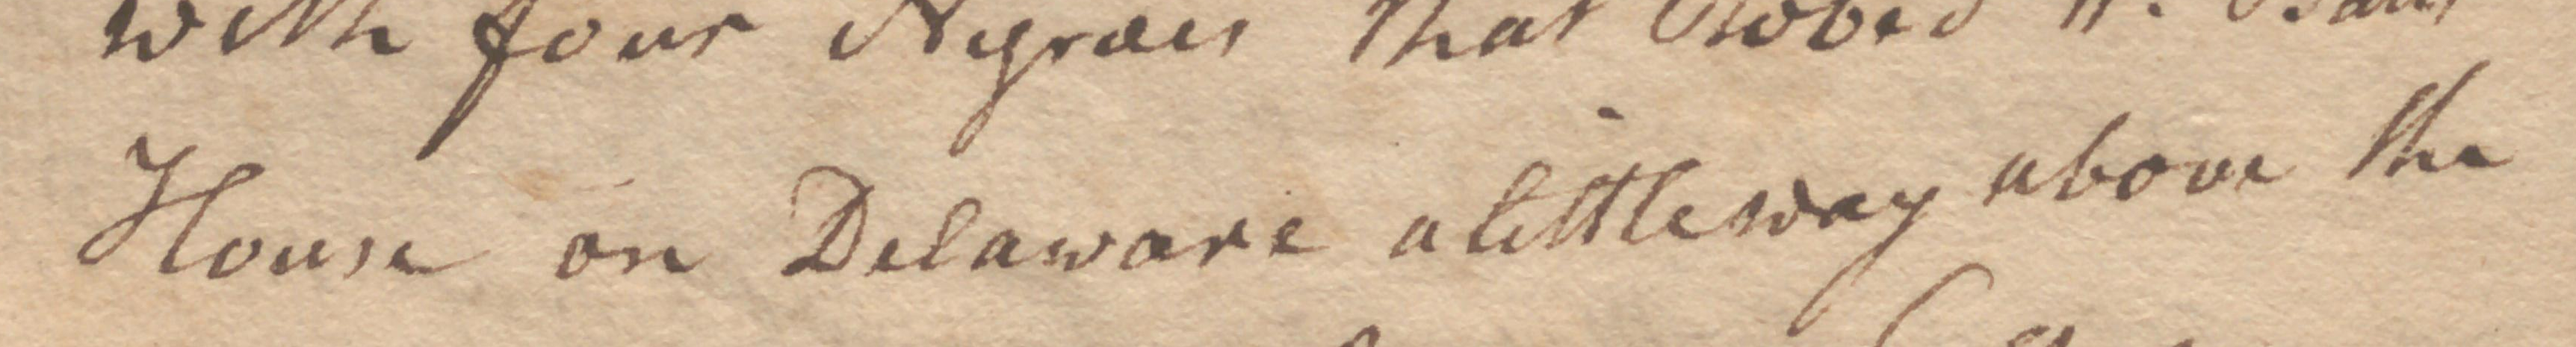House on Delaware a little way above the
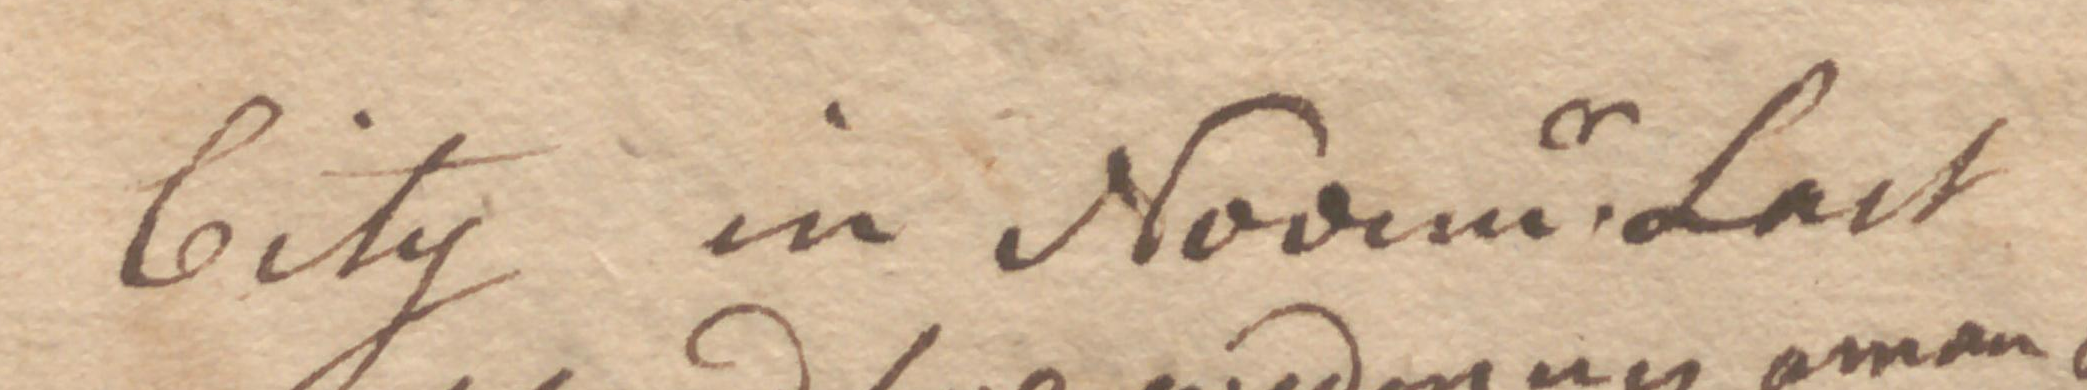City, in Novem^r. Last
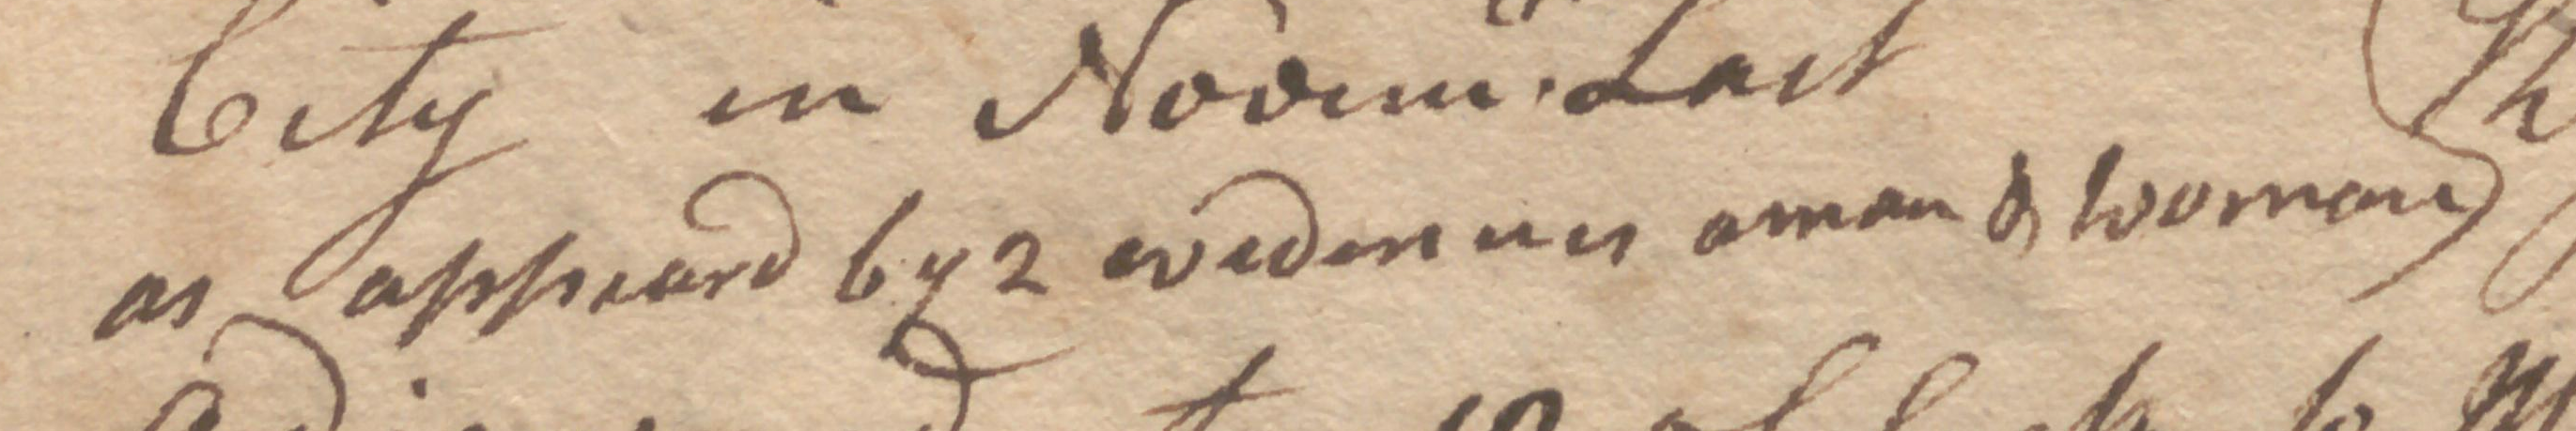as appeard by 2 evidences a man & woman
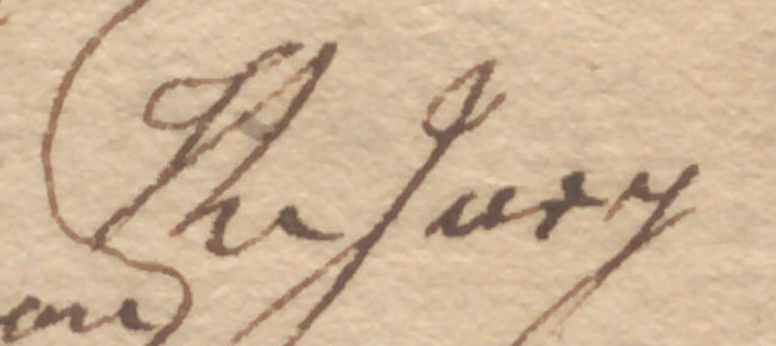The Jury
